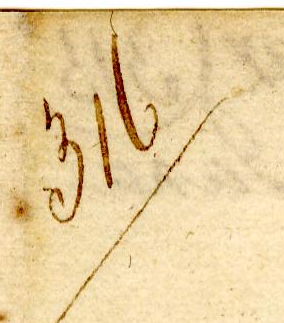316
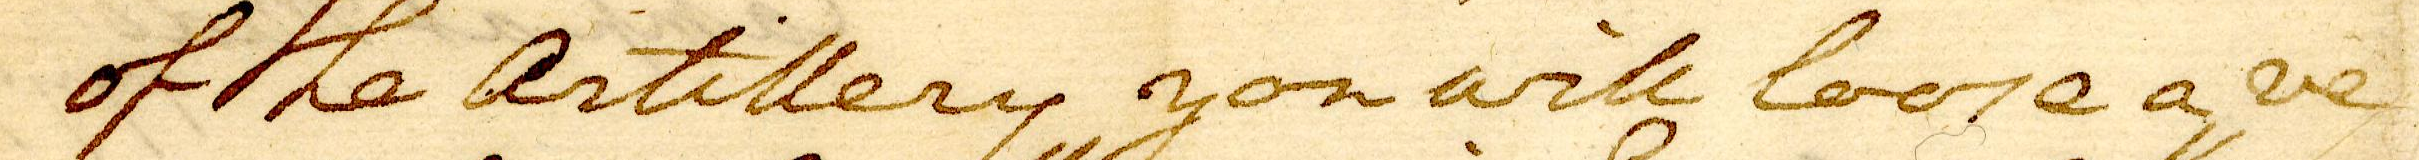of the Artillery you will loose a ve
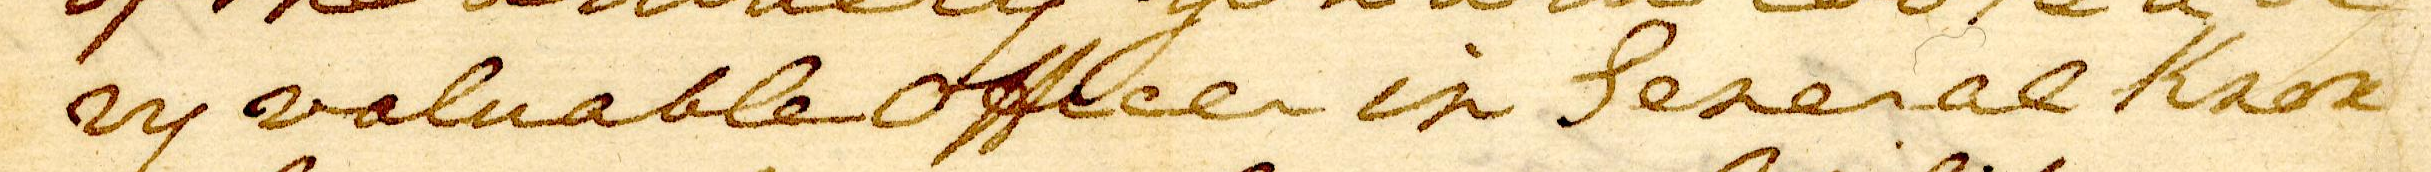ry valuable officer in General Knox
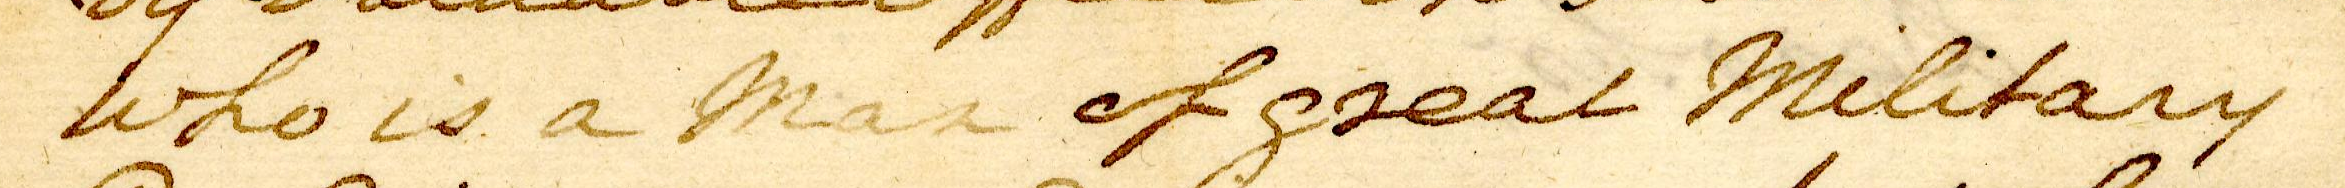who is a man of great Military
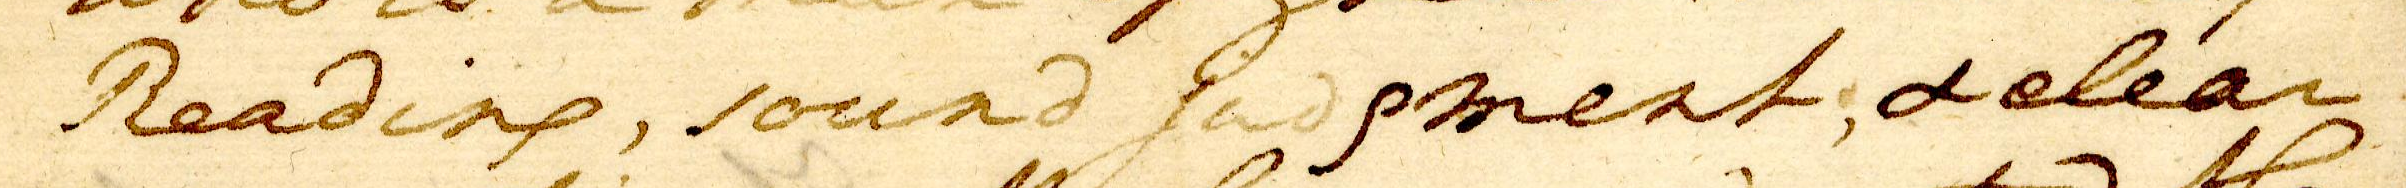Reading, sound Judgement, & clear
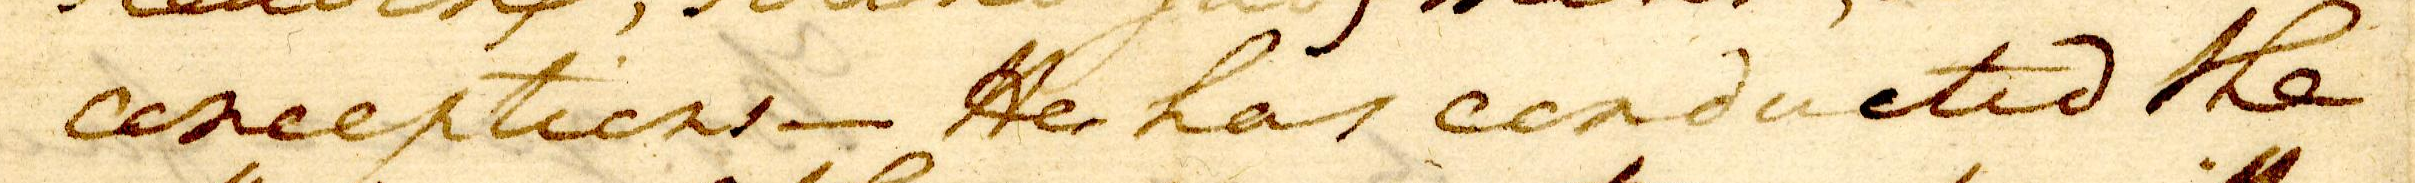conceptions- He has conducted the
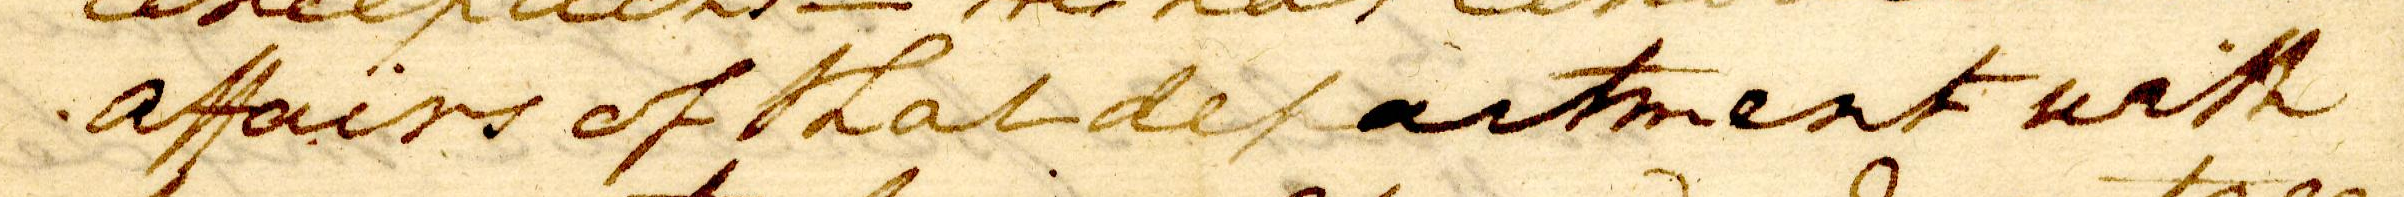affairs of that department with
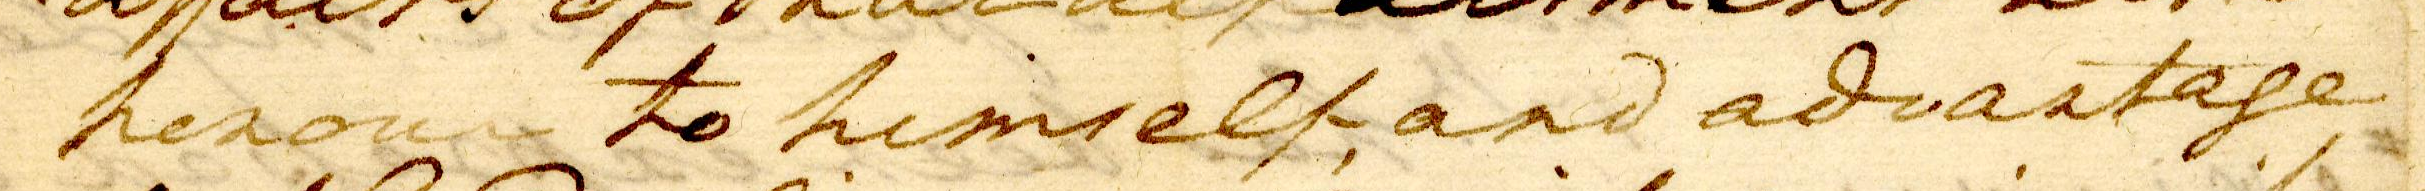honour to himself, and advantage
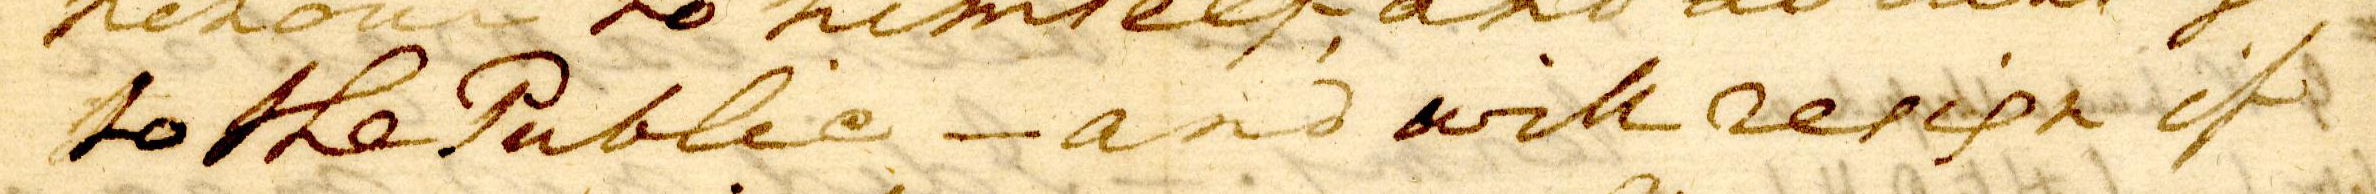to the Public- and will resign if
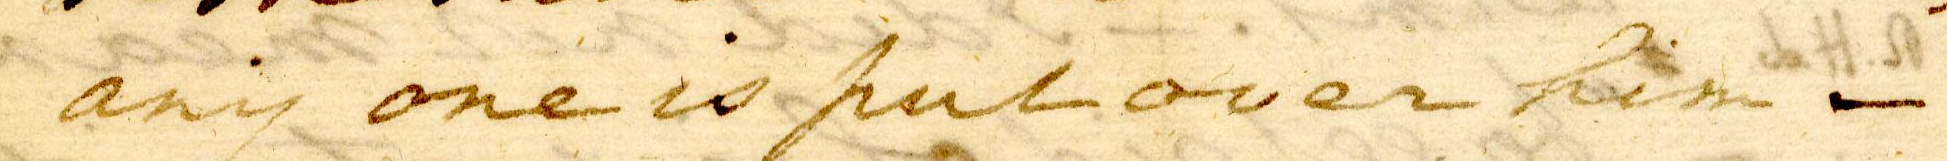any one is put over him.-
